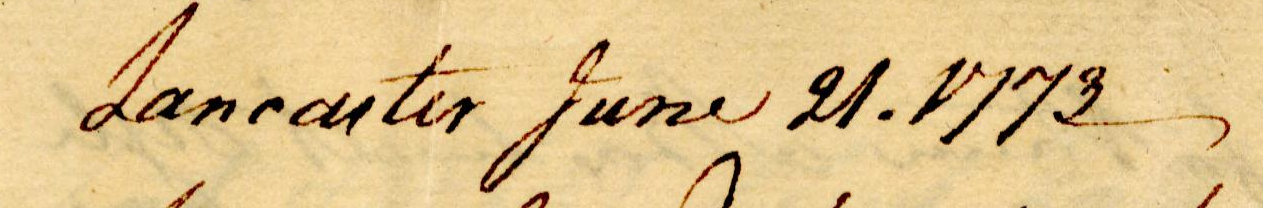Lancaster June 21. 1773
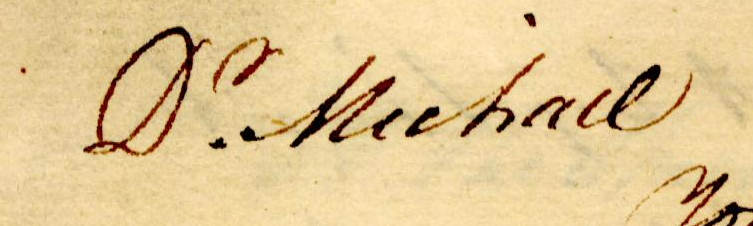D^r. Michael
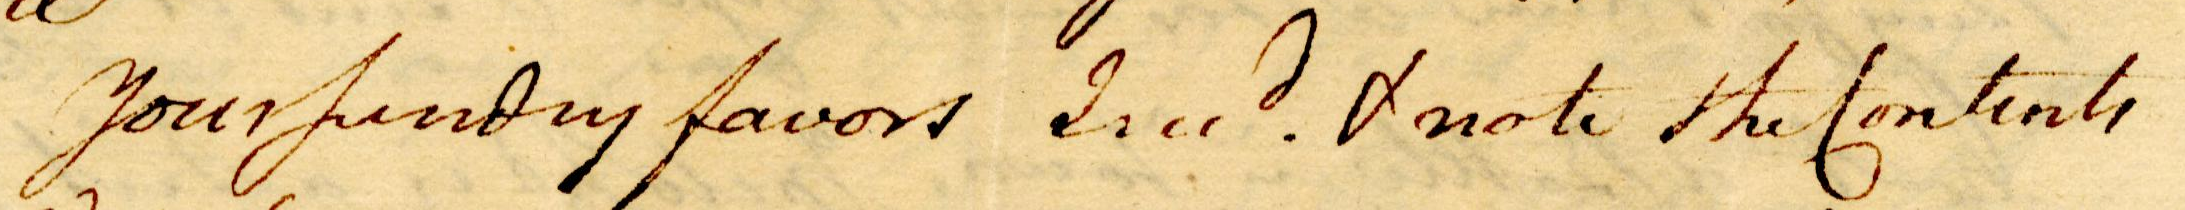Your sundry favors I rec^d. & note the Contents
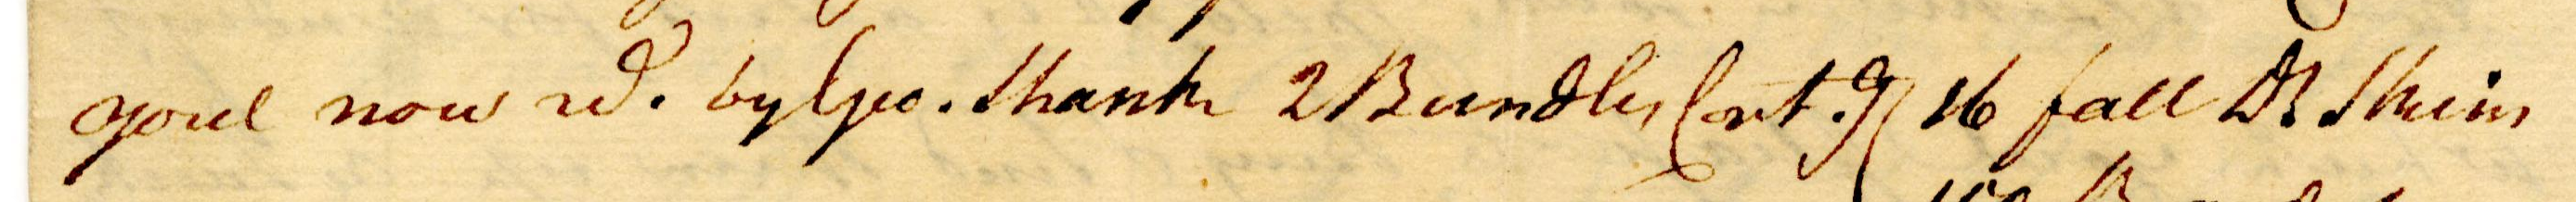youl now re^e. by Geo. Shank 2 Bundles Cont.^g 16 fall D^r. Skin
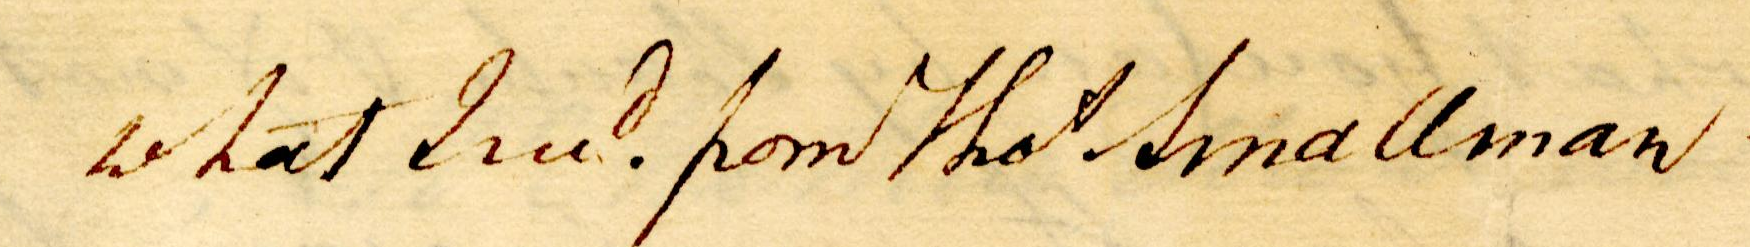what I re^d. from Tho^s Smallman
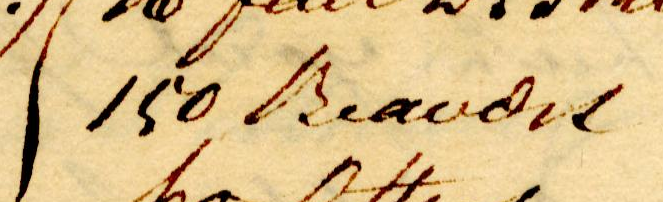150 Beavers
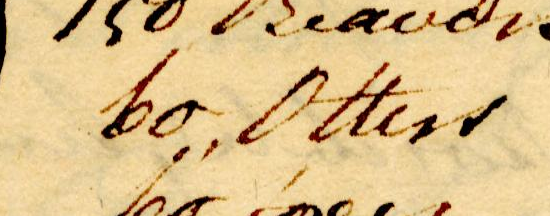60. Otter
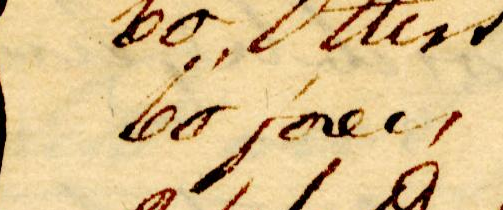60 foxes
